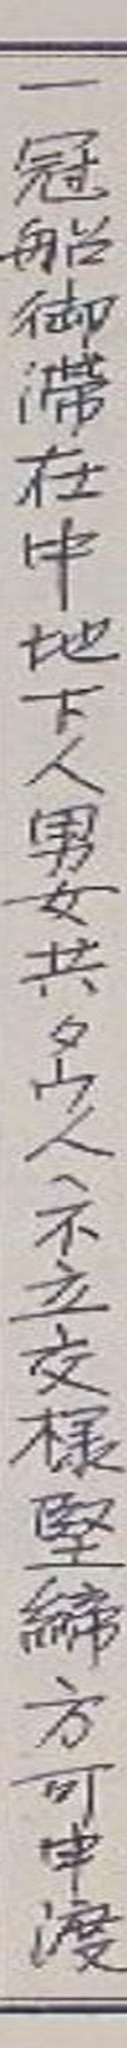一冠船御滞在中地下人男女共たう人へ不立交様堅締方可申渡
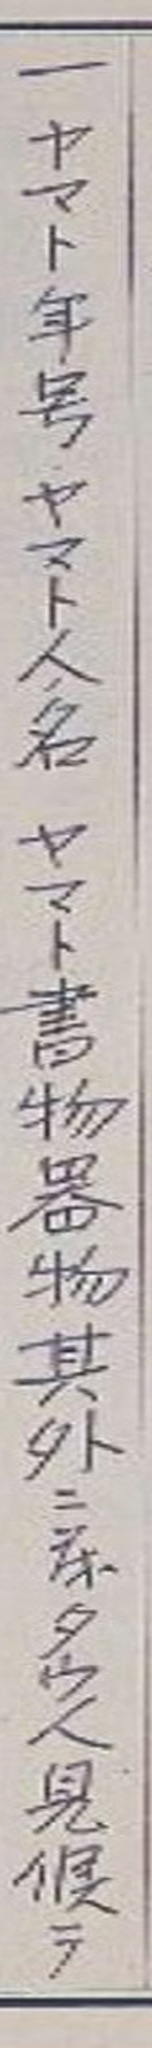一やまと年号やまと人の名やまと書物器物其外にもたう人見候て
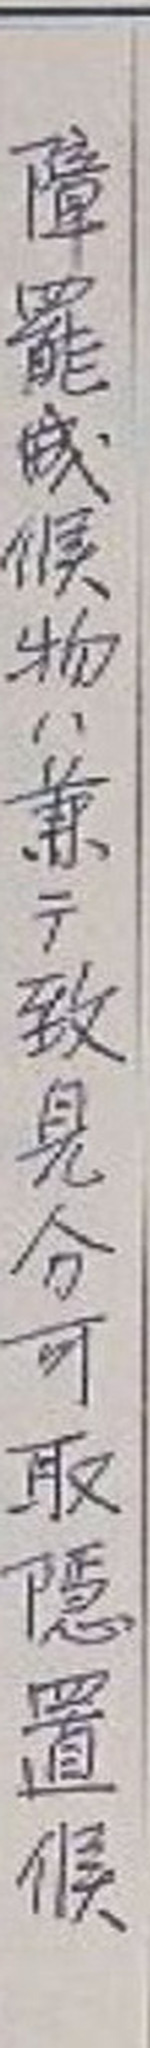障罷成候物は兼て致見分可取隠置候
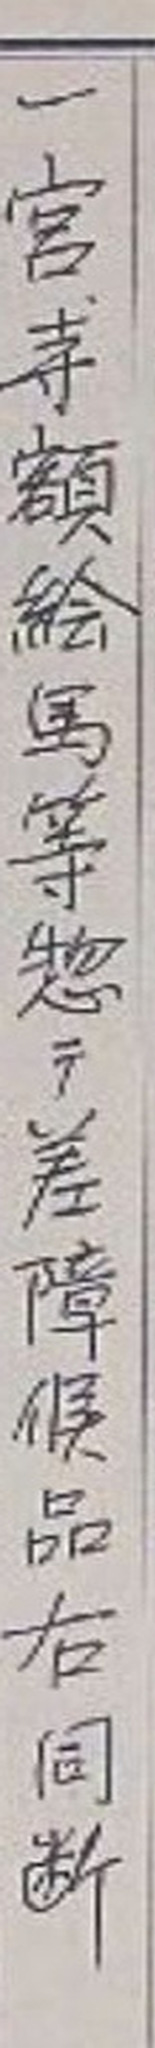一宮寺額絵馬等惣て差障候品右同断
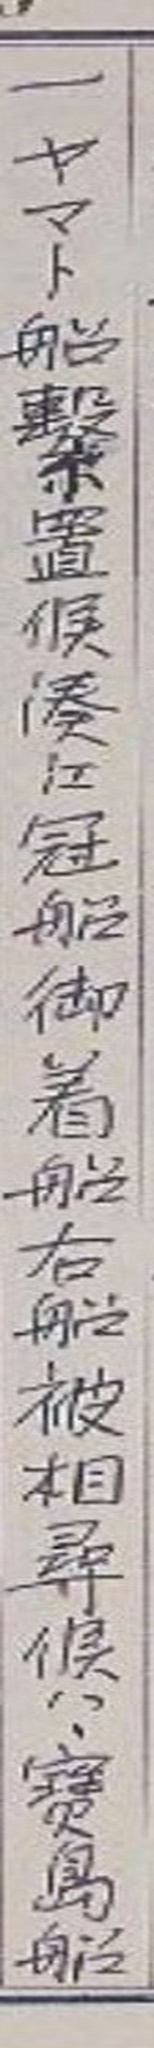一やまと船繋置候湊え冠船御着船右船被相尋候はゝ宝島船
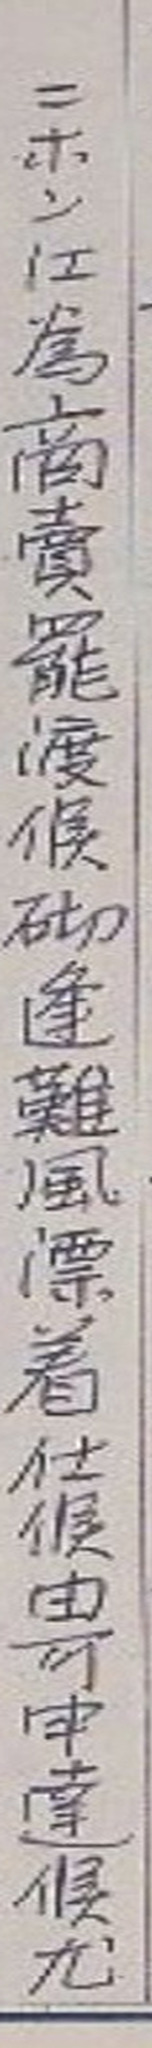にほんえ為商売罷渡候砌逢難風漂着仕候由可申達候尤
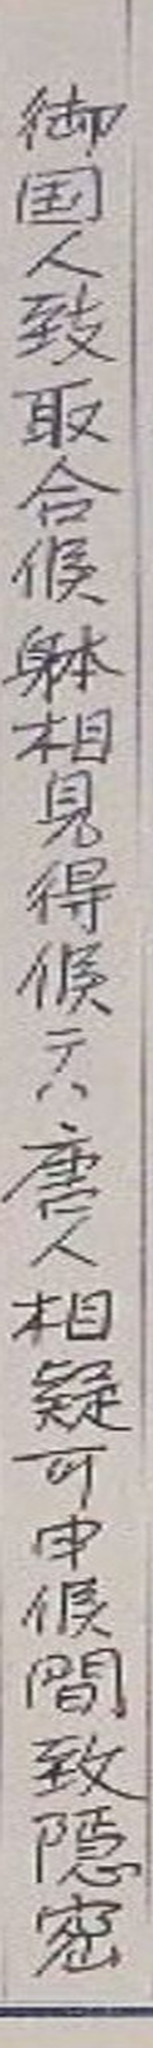御国人致取合候躰相見得候ては唐人相疑可申候間致隠密
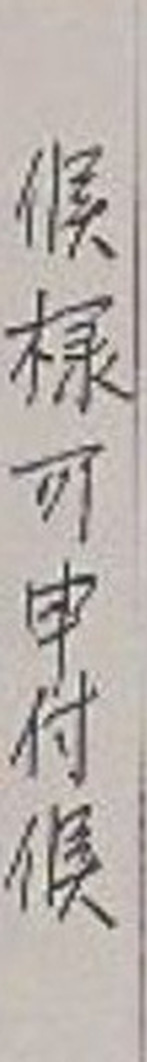候様可申付候

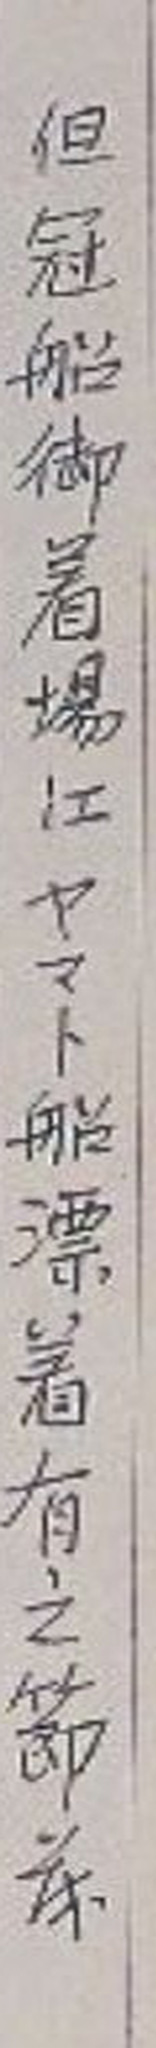但冠船御着場えやまと船漂着有之節も
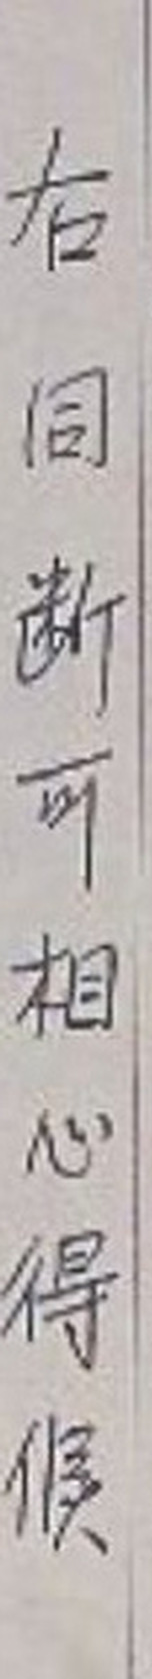右同断可相心得候
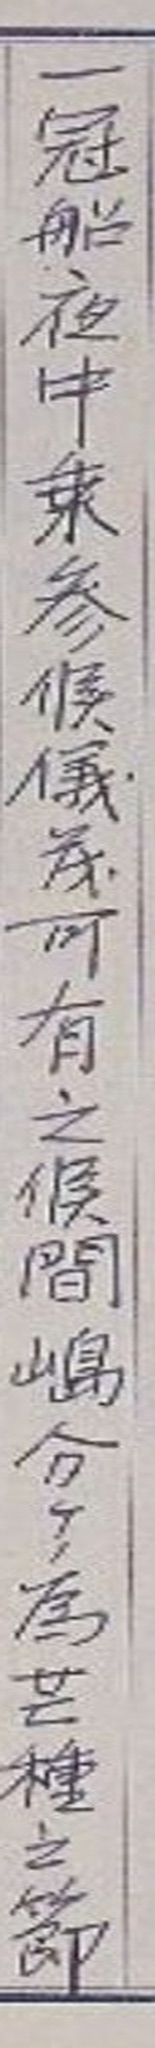一冠船夜中乗参候儀も可有之候間島分けの為芒種之節
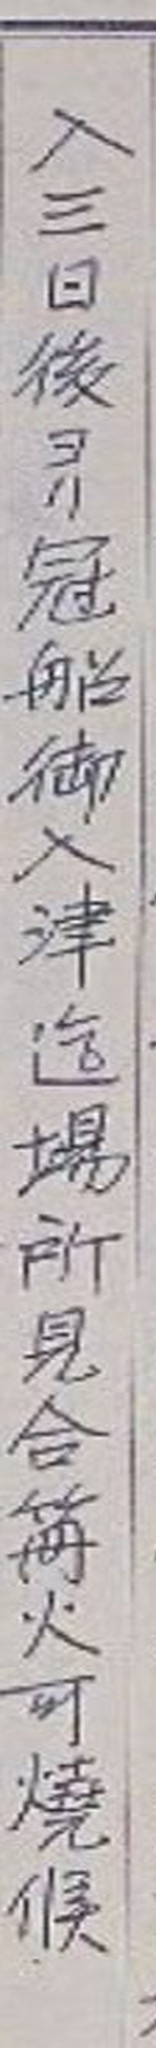入三日後より冠船御入津迄場所見合笧火可焼候
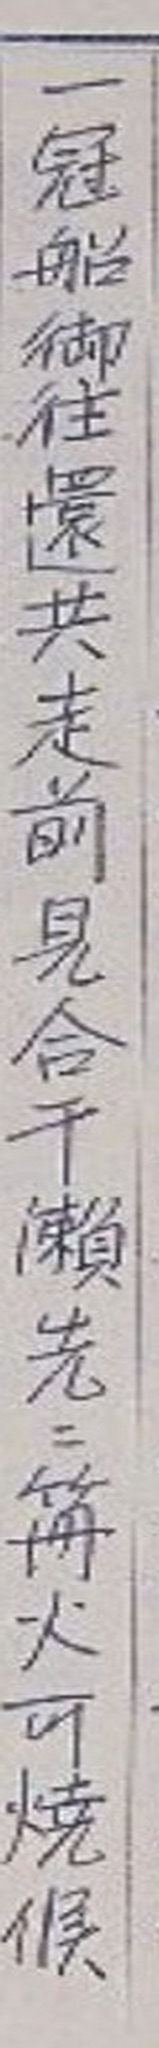一冠船御往還共走前見合干瀬先に笧火可焼候
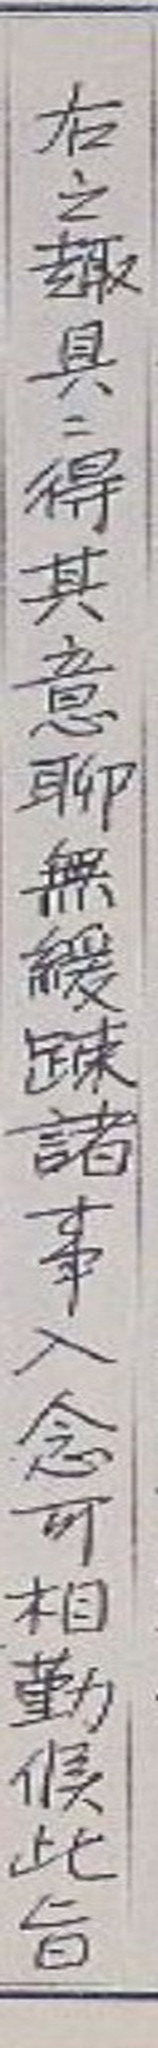右之趣具に得其意聊無緩疎諸事入念可相勤候此旨
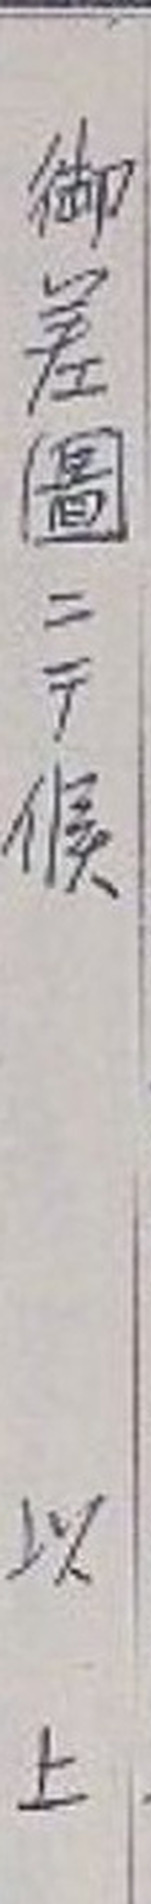御差図にて候以上
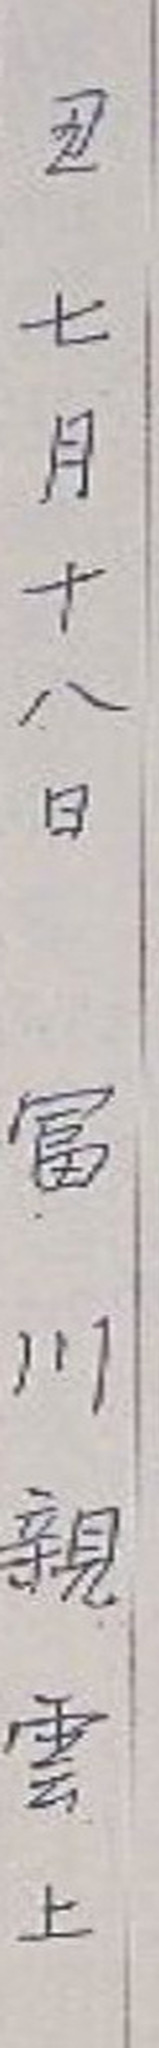丑七月十八日冨川親雲上
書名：支那冊封使来琉諸記 下巻
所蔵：University of the Ryukyus Library
